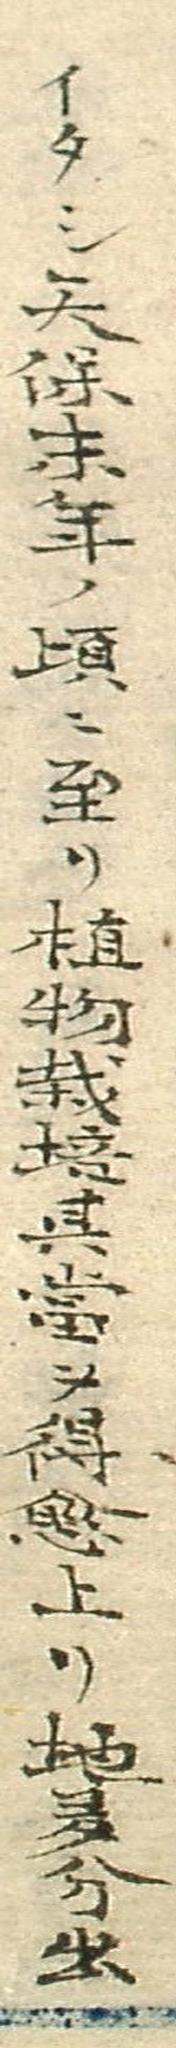イタシ天保末年ノ頃ニ至リ植物栽培其当ヲ得愈上リ地多分出
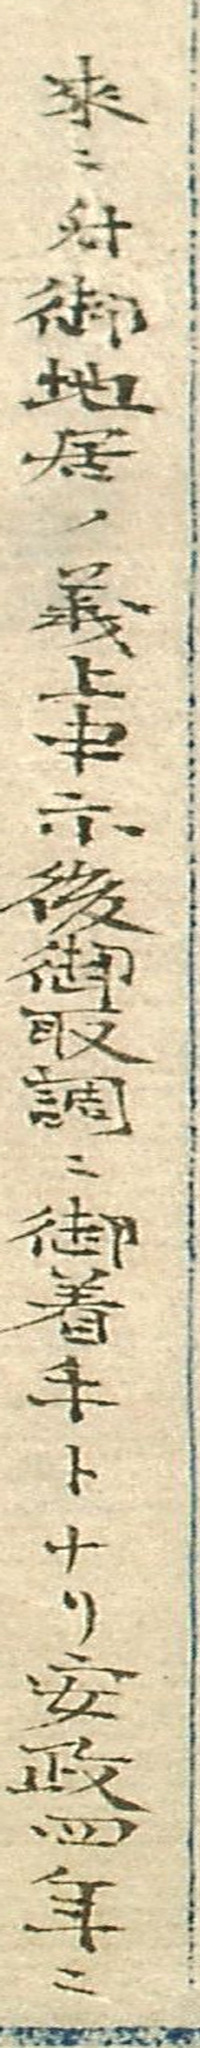来ニ付御地居ノ義上申示後御取調ニ御着手トナリ安政四年ニ
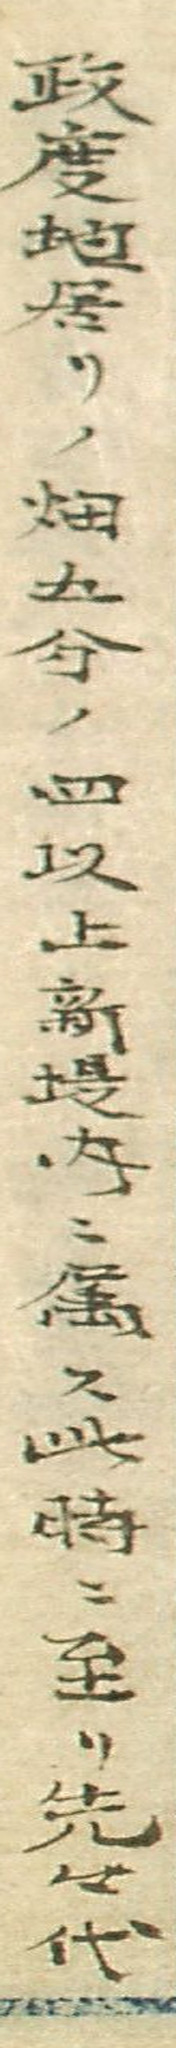政度地居リノ畑五分ノ四以上新堤内ニ属ス此時ニ至リ先々代

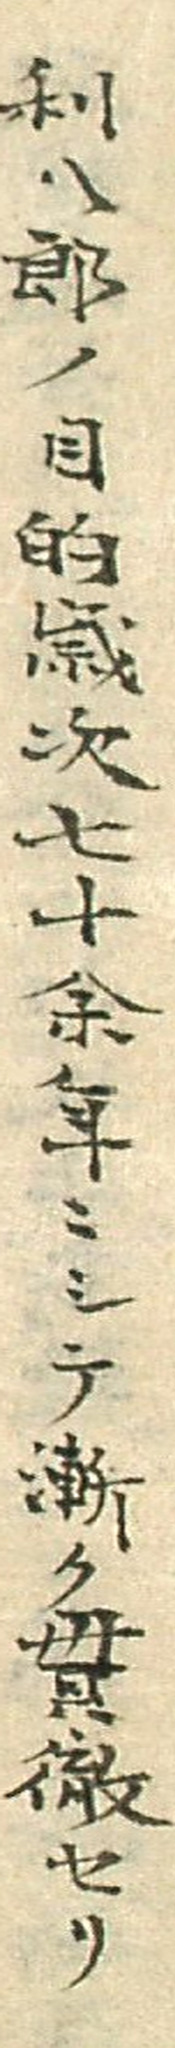利八郎ノ目的歳次七十余年ニシテ漸ク貫徹セリ
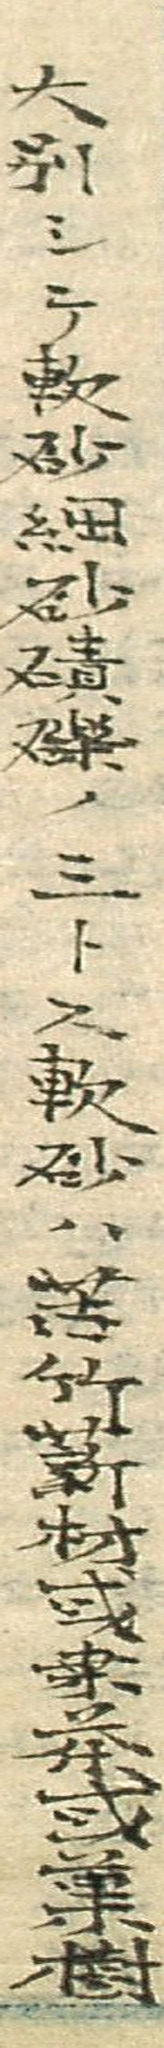大別シテ軟砂細砂磧礫ノ三トス軟砂ハ苦竹薪材或桑茶或菓樹
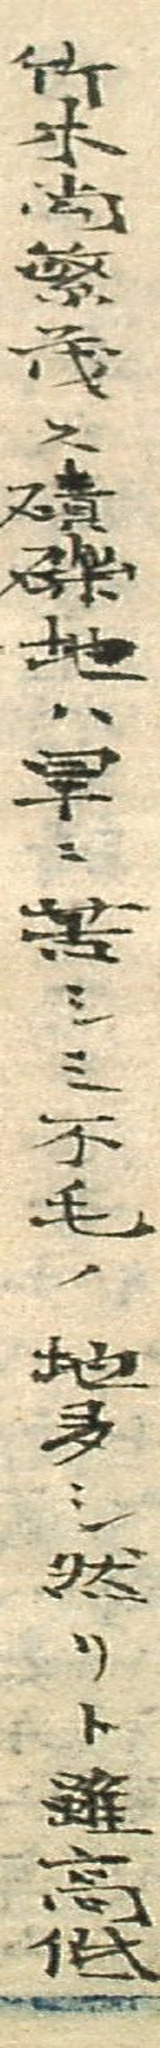竹木尚繁茂ス磧礫地ハ旱ニ苦シミ不毛ノ地多シ然リト雖高低
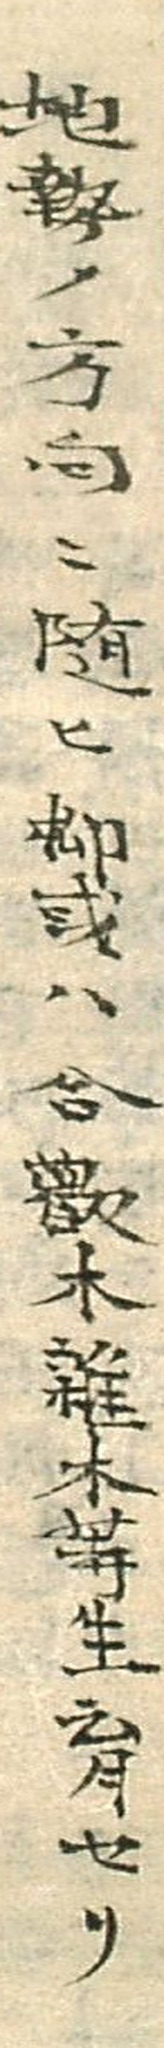地勢ノ方向ニ随ヒ柳或ハ合歓木雑木等生育セリ
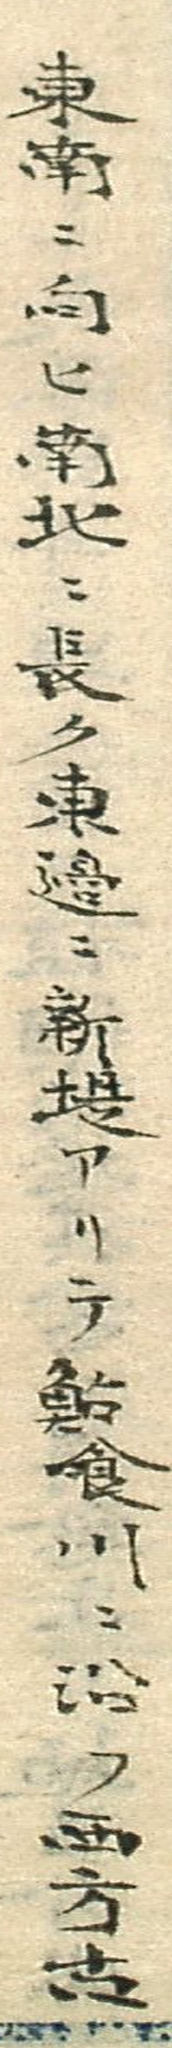東南ニ向ヒ南北ニ長ク東辺ニ新堤アリテ鮎喰川ニ沿フ西方古
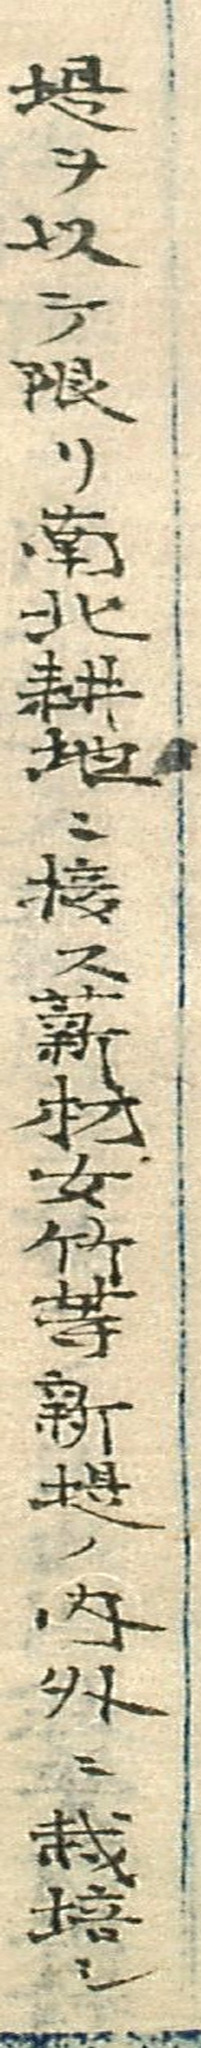堤ヲ以テ限リ南北耕地ニ接ス薪材女竹等新堤ノ内外ニ栽培シ
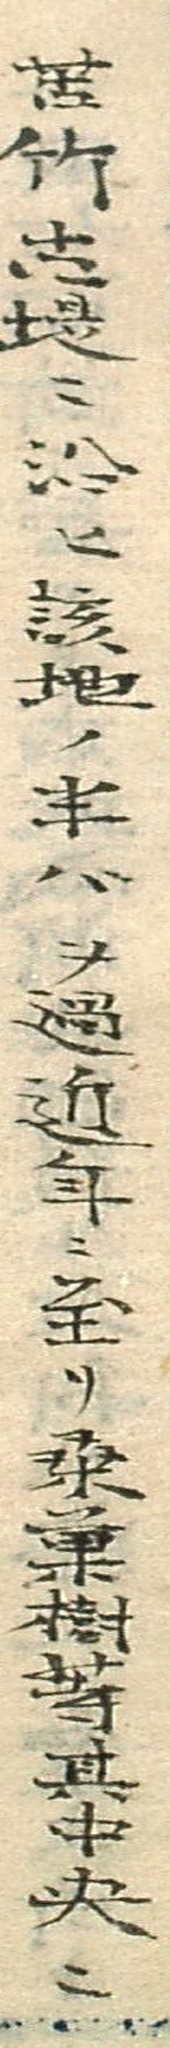苦竹古堤ニ沿ヒ該地ノ半バヲ過近年ニ至リ桑菓樹等其中央ニ
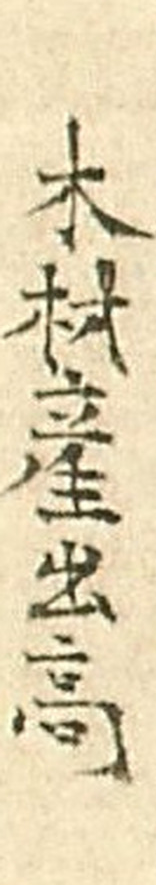木材産出高
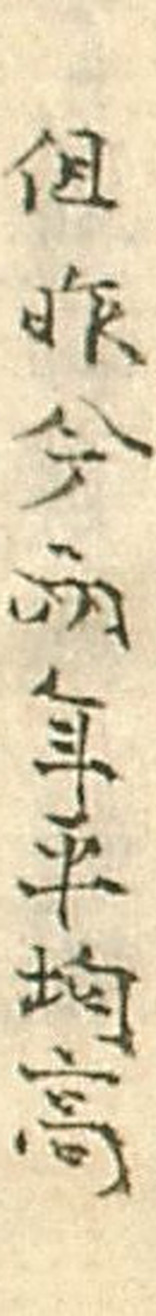但昨今両年平均高
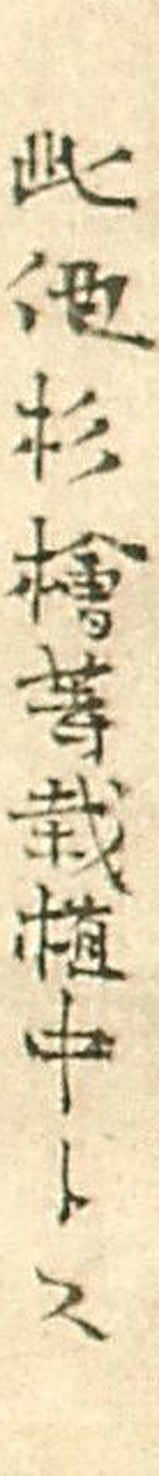此他杉檜等栽植中トス
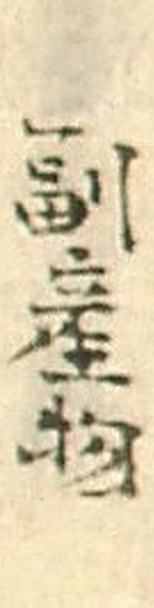副産物

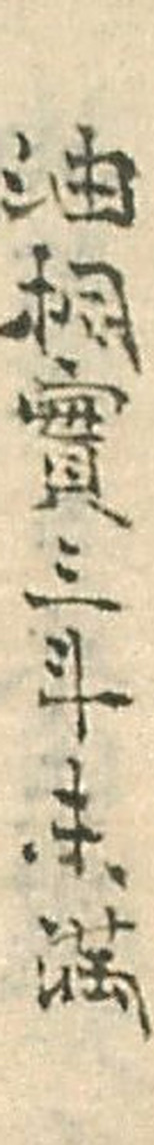油桐実三斗未満
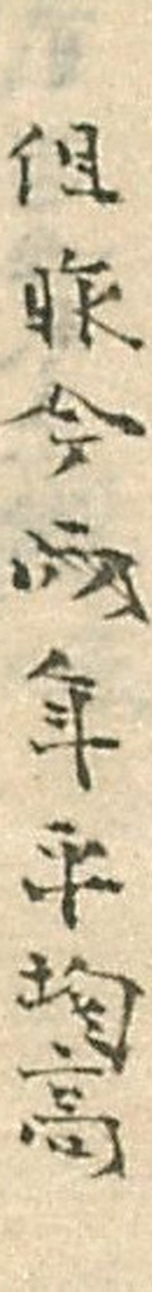但昨今両年平均高
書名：山林共進会取調書
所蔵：鳴門教育大学 Naruto University of Education
